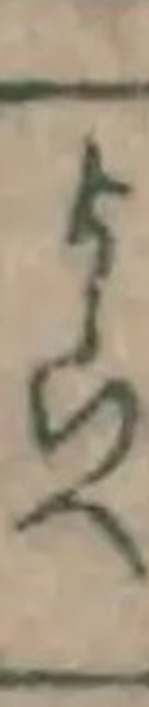よしいへ
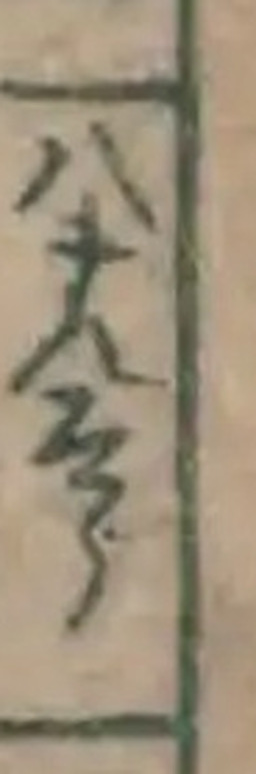八まん太郎
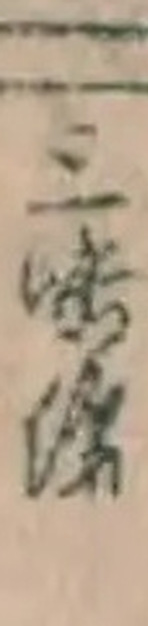三味線
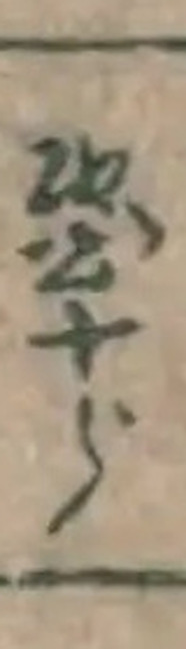團十郎
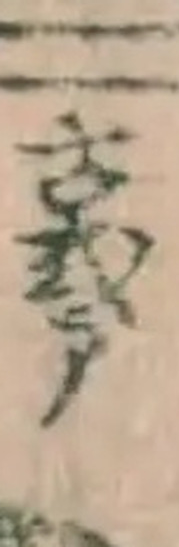小式部
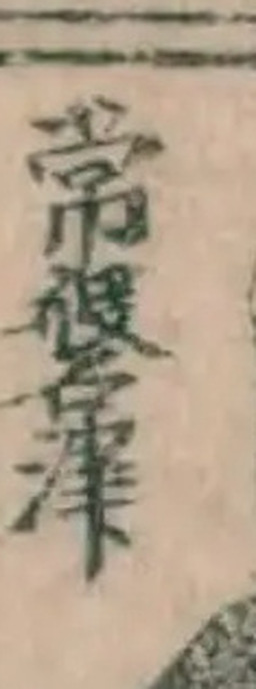常磐津
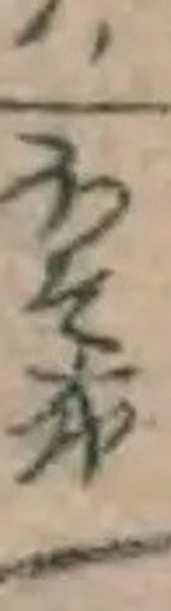ほそ布
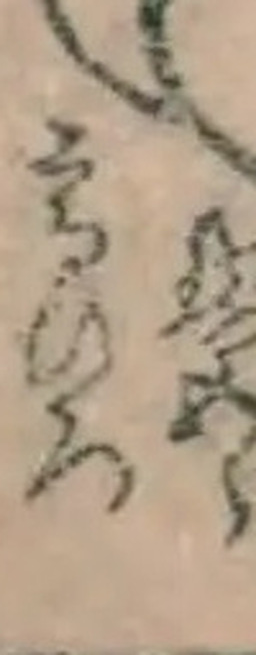高ひろ
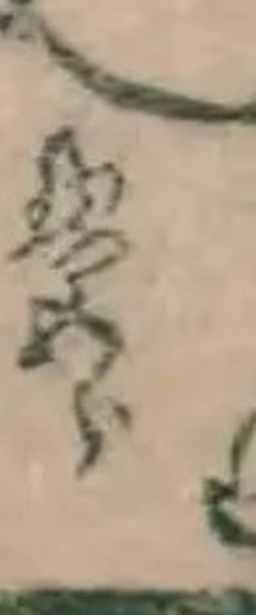悪五郎
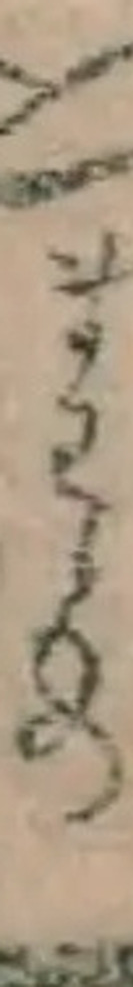まわしもの
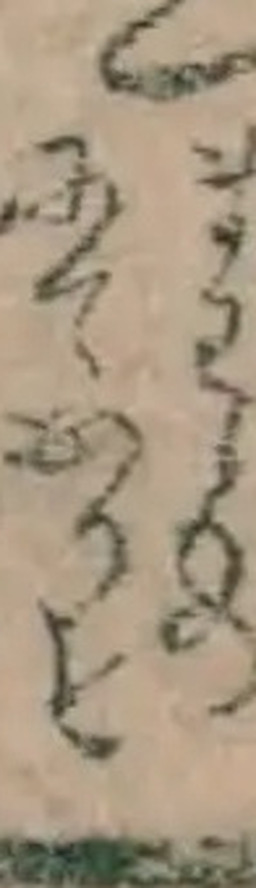にておりを
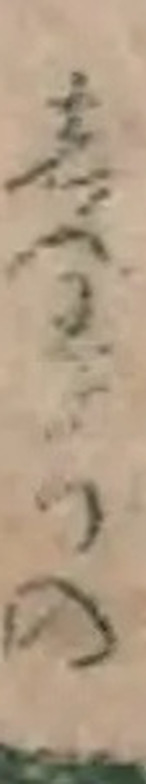しん王よりの
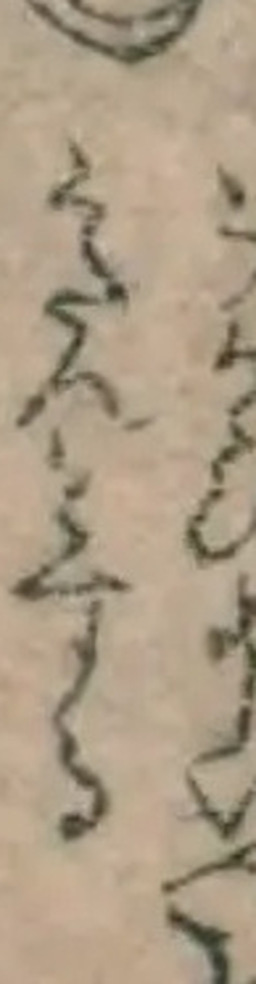うたんとする
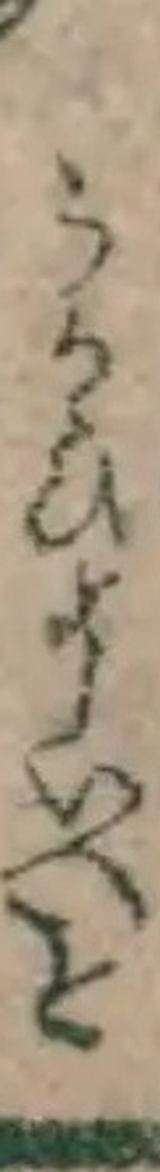うかゝひよしいへを
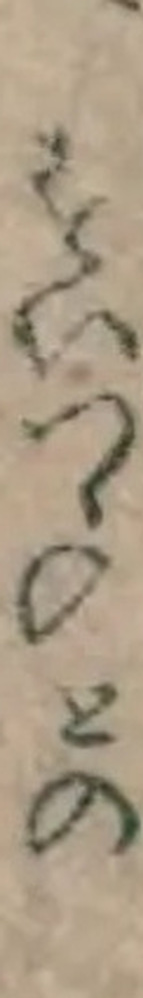すいつゝのの
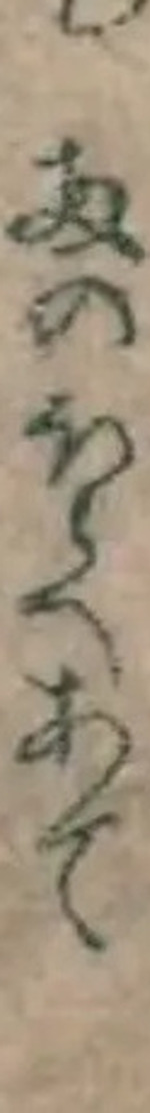両のほうへあて
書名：伊達錦對将 : 森田座
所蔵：国立国会図書館 National Diet Library, JAPAN
